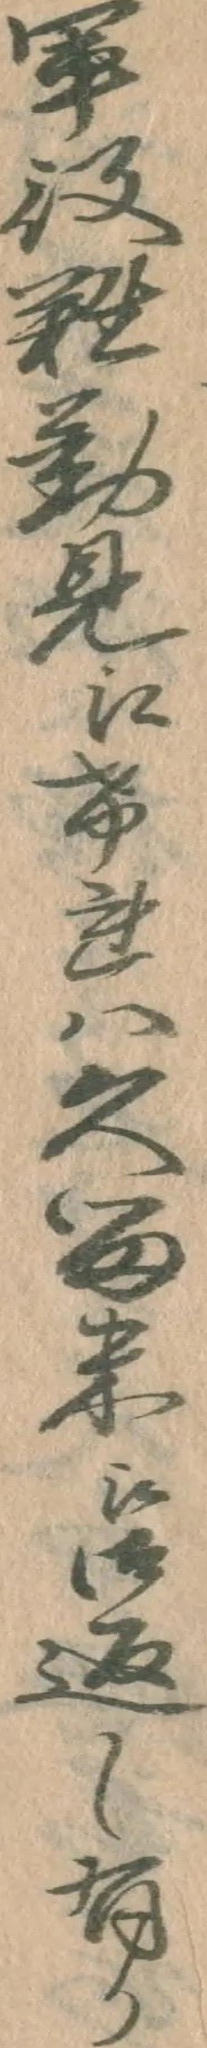軍役難勤見江希連は久留米江御返し有り
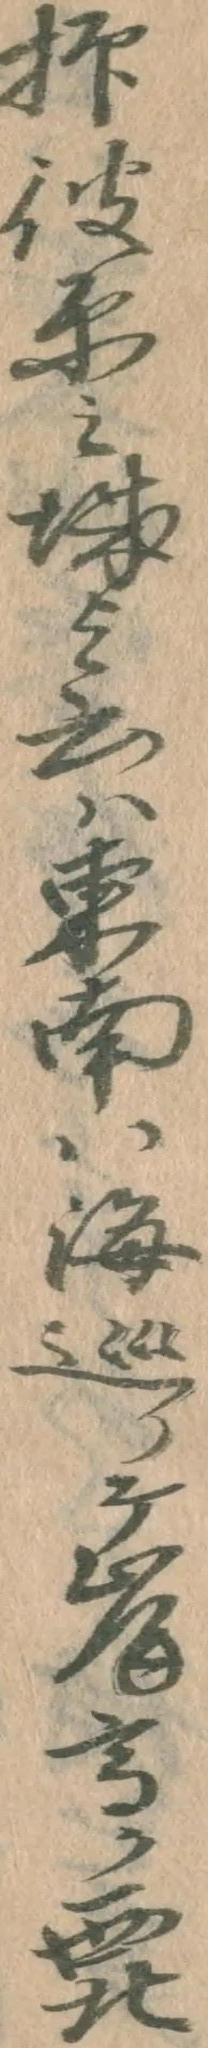抑彼原之城与云は東南は海巡りて岸高く西北
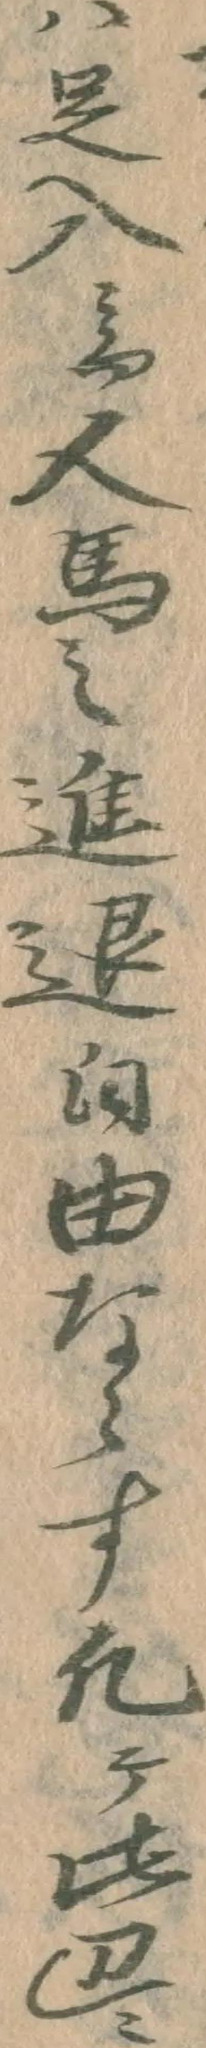は足入に而人馬之進退自由ならす凡て此辺に
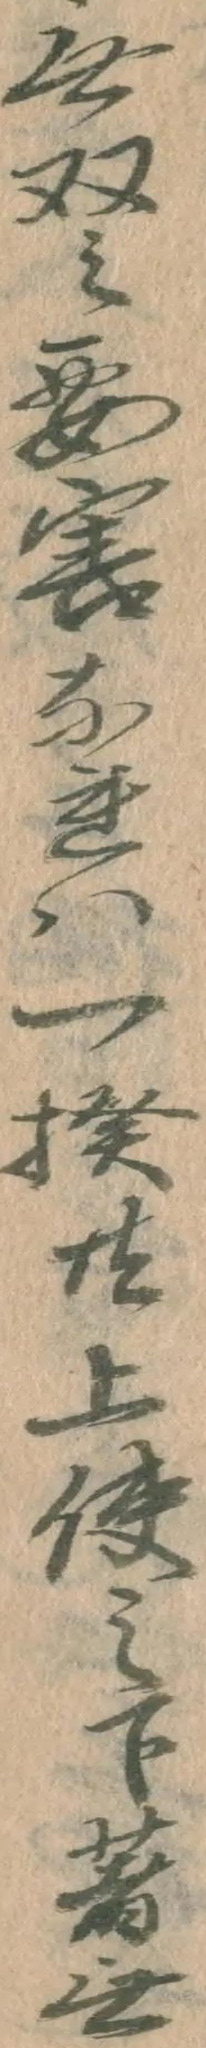無双之要害な連は一揆共上使之下著無
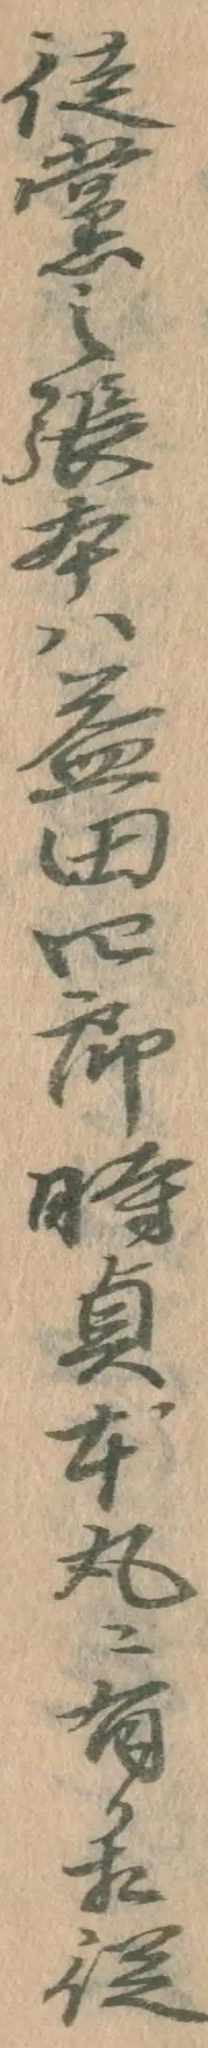徒党之張本は益田四郎時貞本丸に有り相従
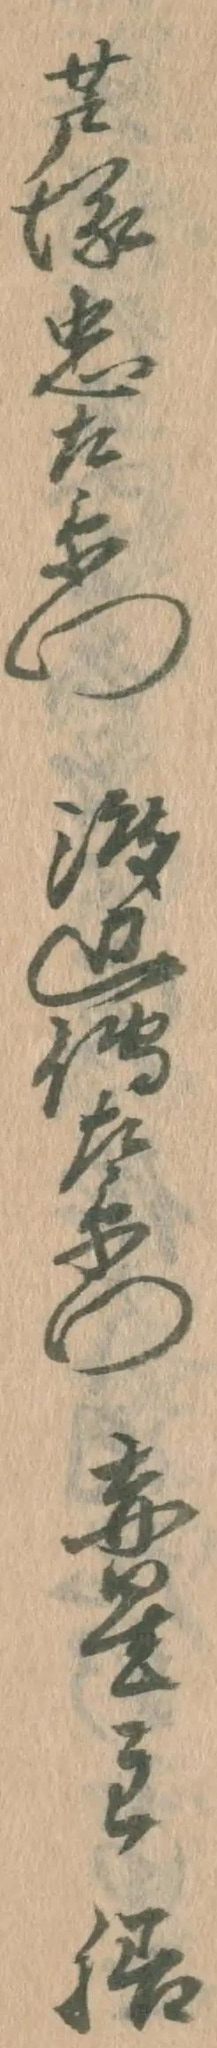芦塚忠左衛門渡辺伝左衛門赤星主膳
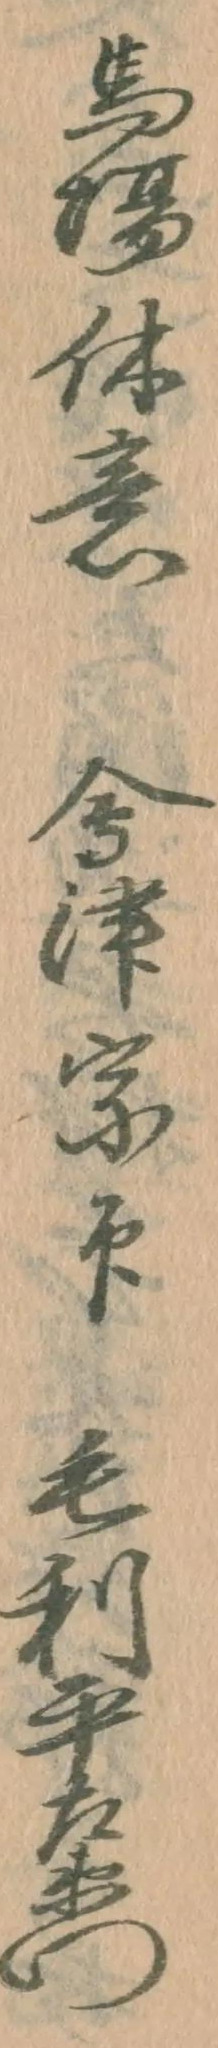馬場休意会津宗印毛利平左衛門
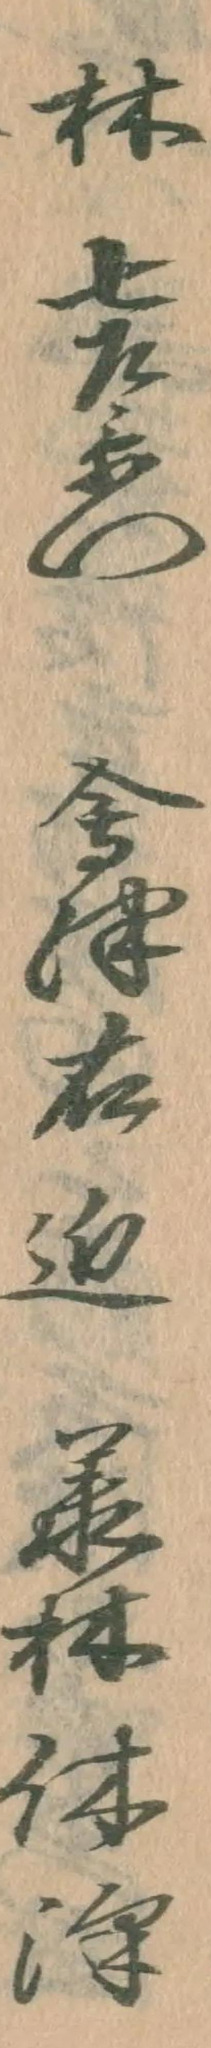林七左衛門会津右近承林休沢
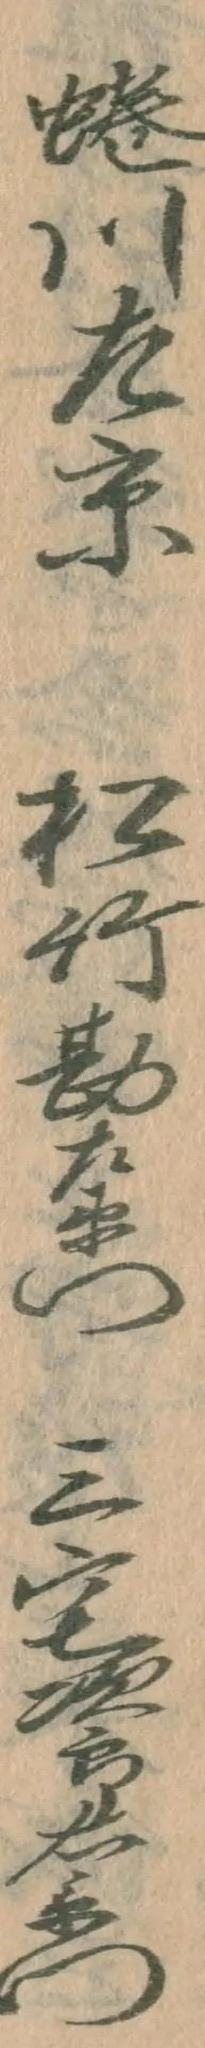蜷川左京松竹勘左衛門三宅次郎右衛門
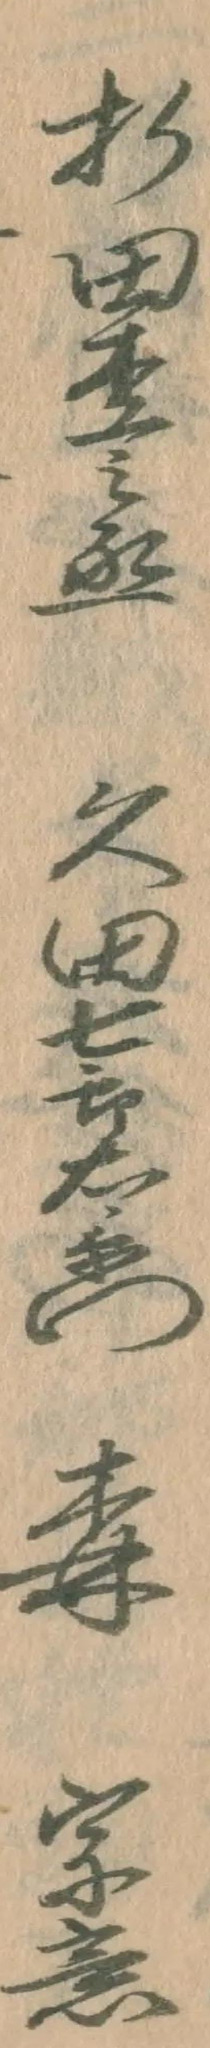杉田杢之丞久田七郎右衛門森宗意
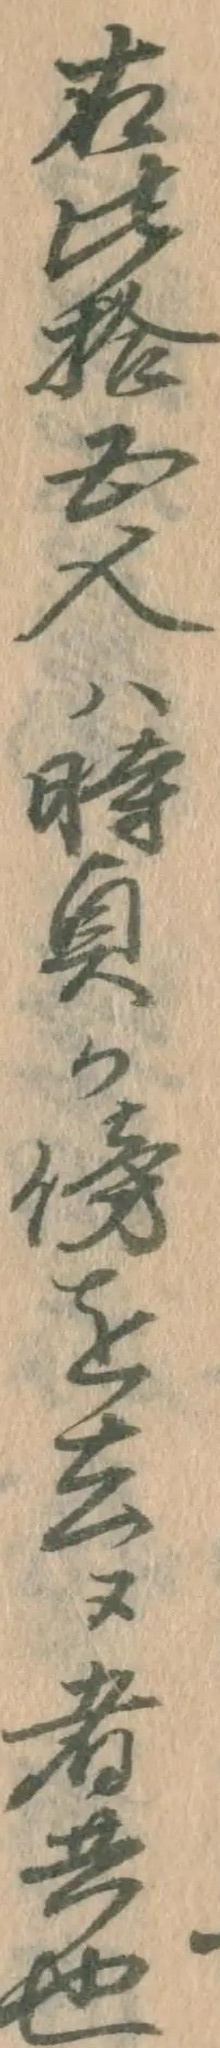右此拾五人は時貞か傍を去ぬ者共也
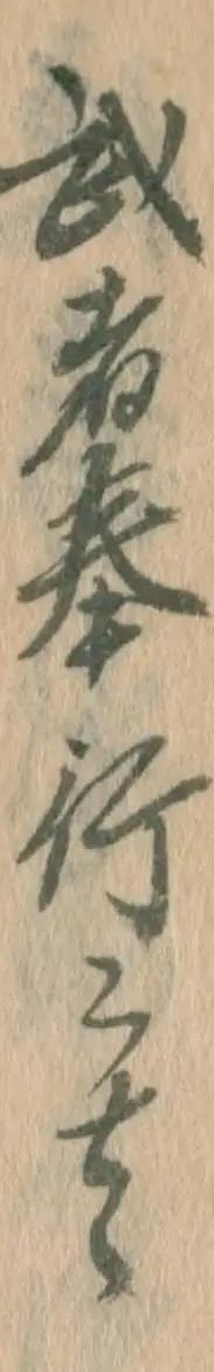武者奉行に者
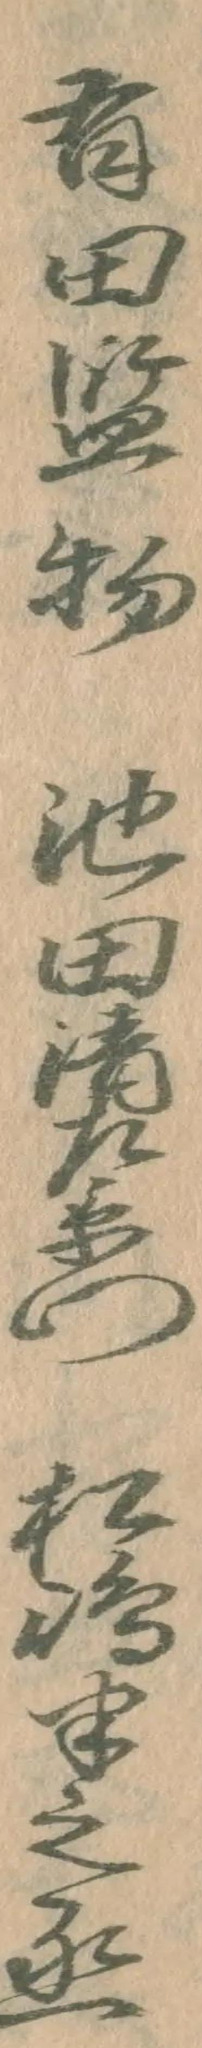有田監物池田清左衛門松島半之丞
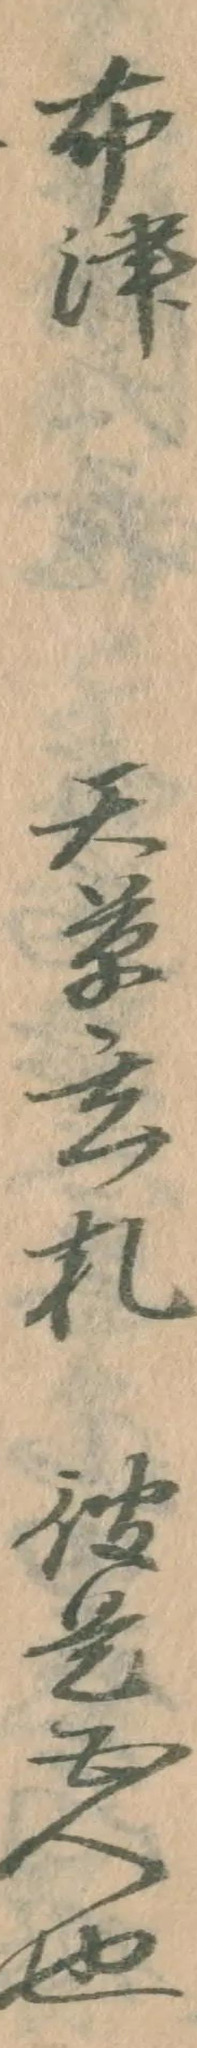布津天草玄札彼是五人也
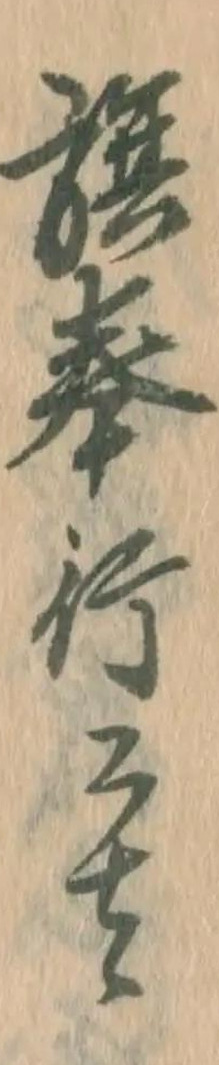旗奉行に者
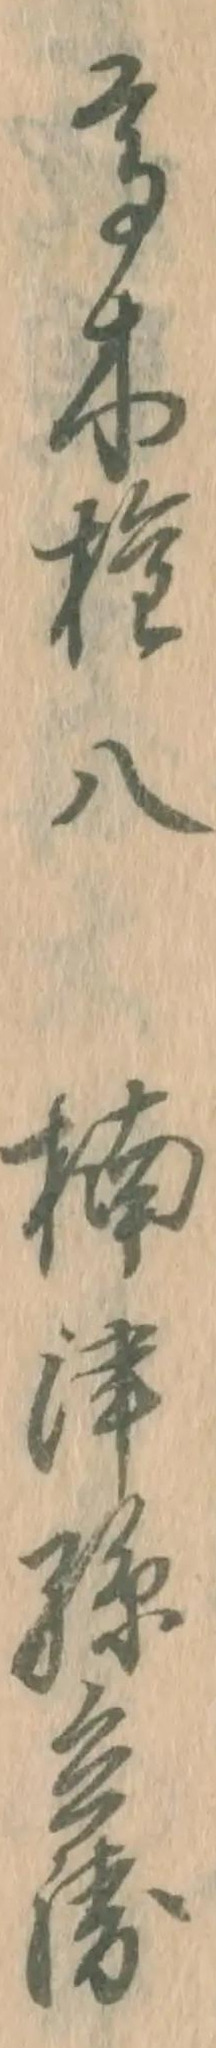高木権八楠津孫兵衛
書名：切支丹御退治記 49巻. [4]
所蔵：国立国会図書館 National Diet Library, JAPAN
